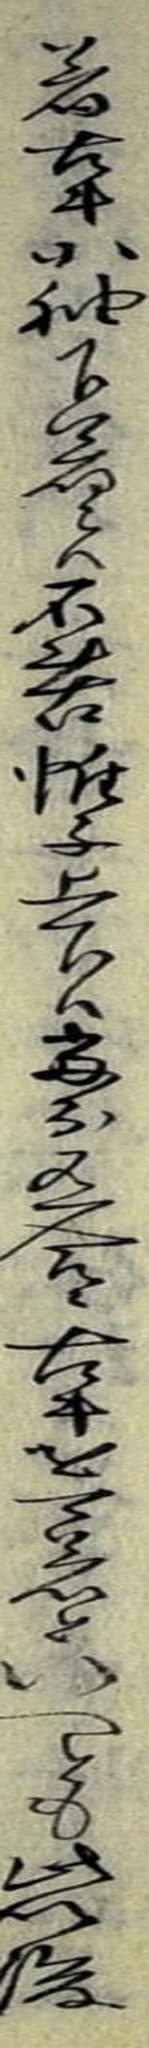着古キ小袖下着ニハ不苦帷子上下ハ当分有合ニ古キを可着といへとも此以後
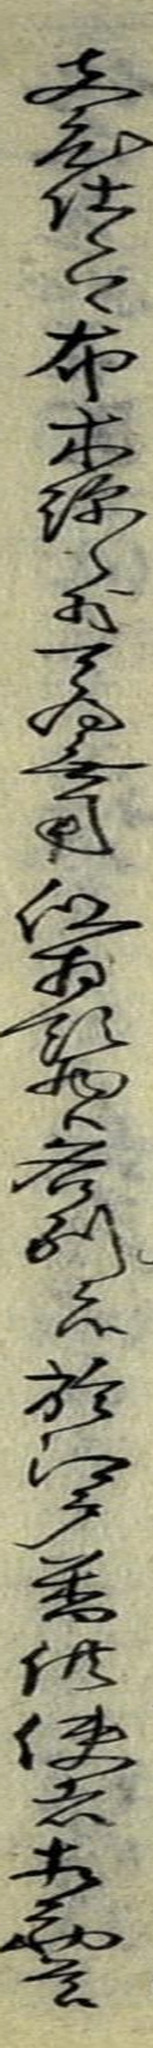支度仕候ハヽ布木綿之外可為無用但拝領物ハ各別ニ候於江戸番供使者相勤節
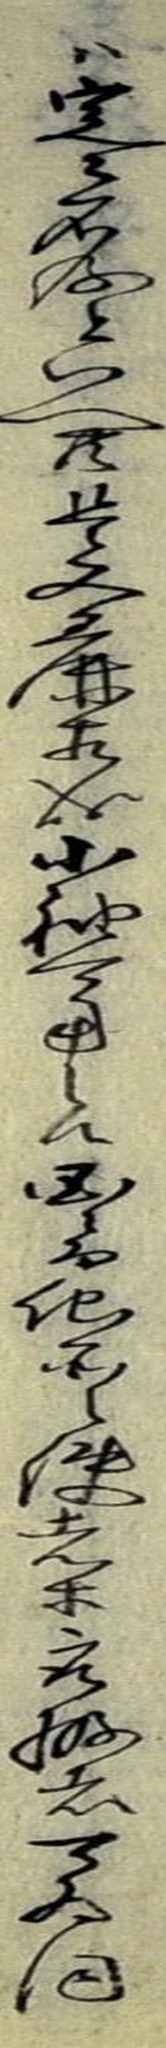ハ定ニ不及といへ共是又麁相成小袖可用之候国ニ而他所之使者等取扱者可為同
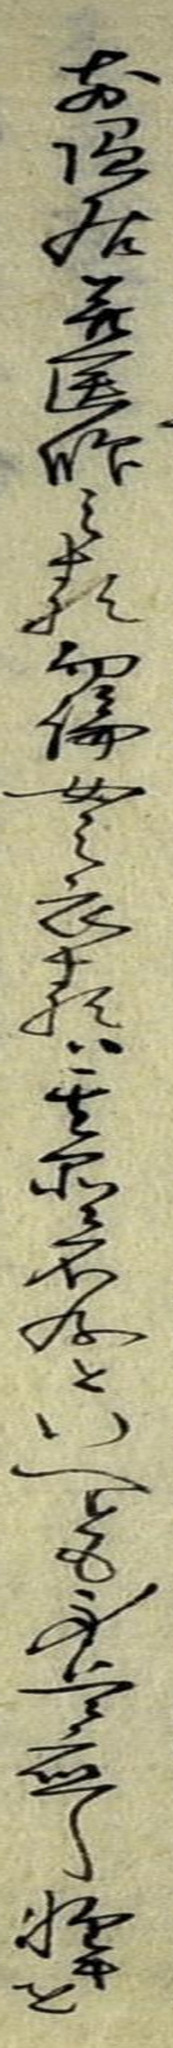前隠居并医師之類勿論女之衣類ハ其品ニ不及といへとも身上ニ応し軽キを
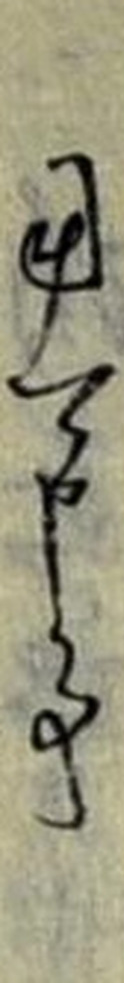用可申事
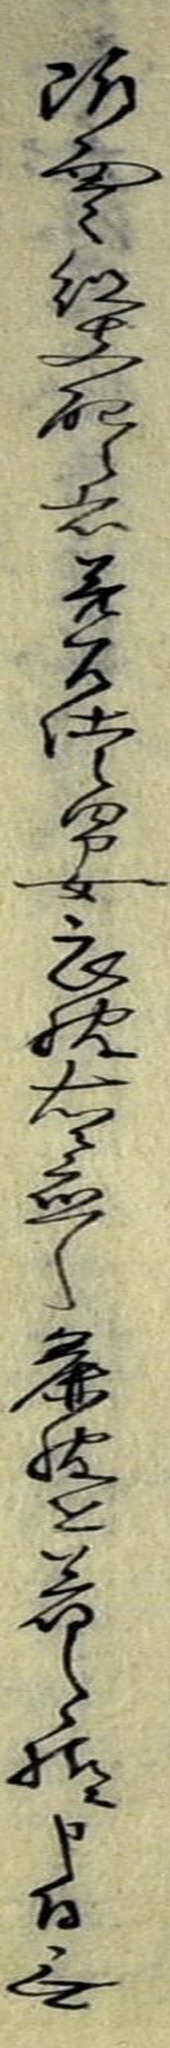附面々組支配之者并召仕之男女衣服右ニ応し麁服を着し候様ニ申付無
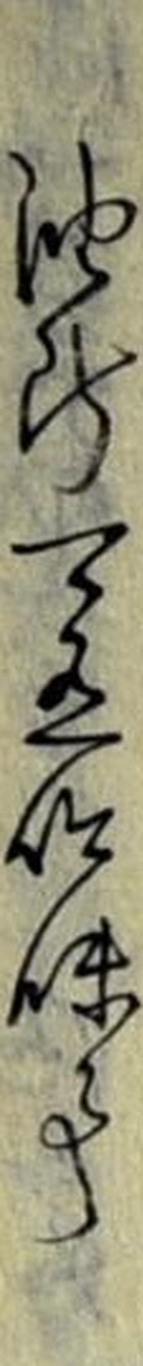油断可有吟味事
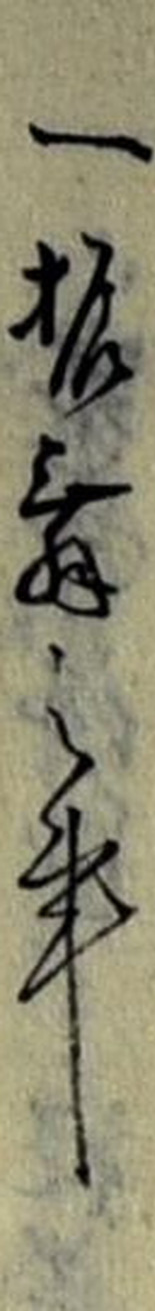一振舞之事

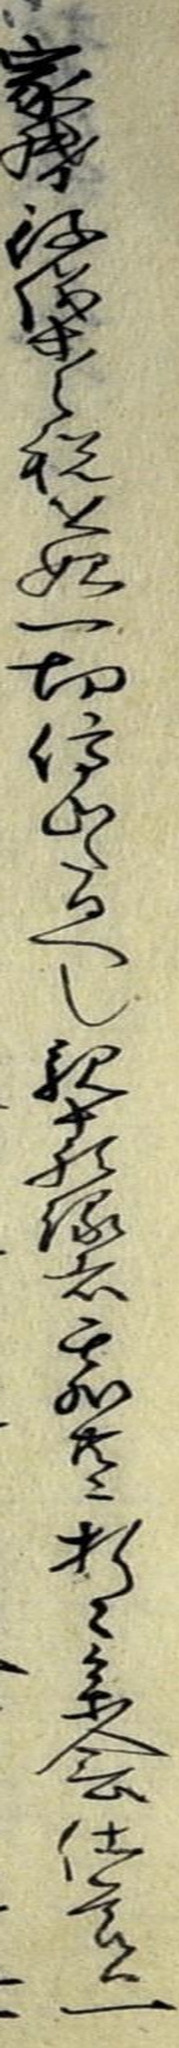家督役儀等之祝を始一切停止たるへし親類縁者其外共ニ折々参会仕節ハ一
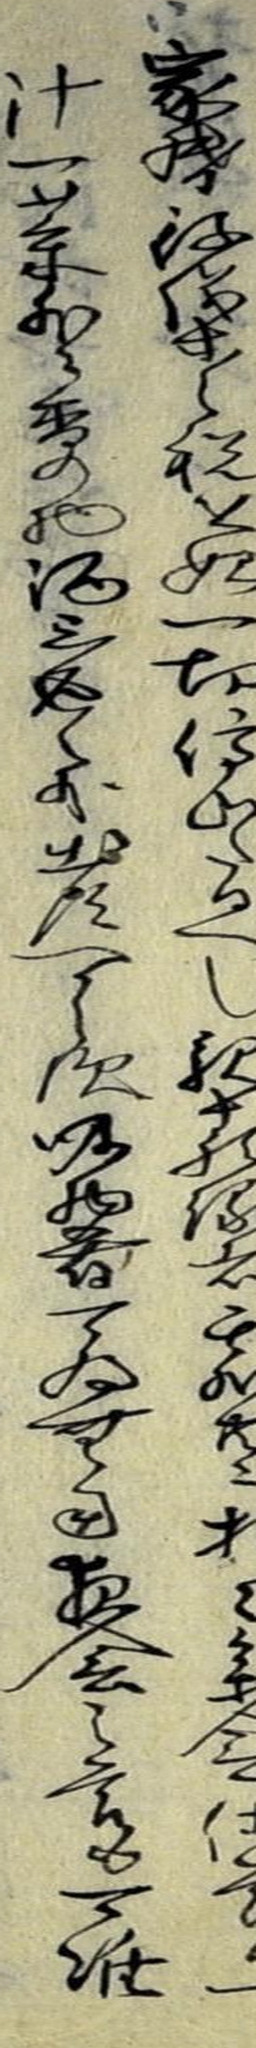汁一菜外ニ香の物酒三返之外出すへからす吸物肴可為無用夜会之節も可准
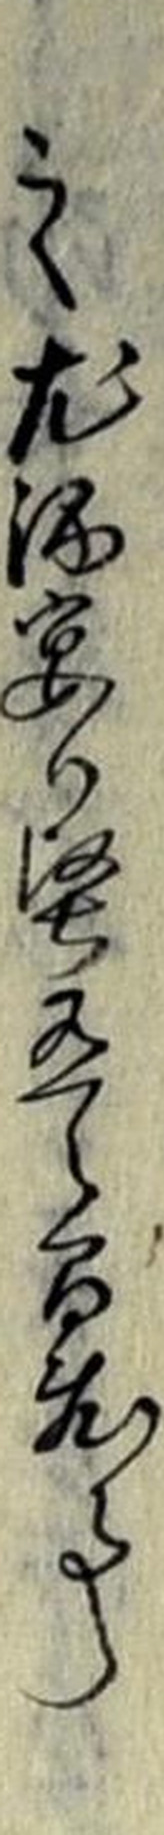之尤酒宴ハ堅有之間敷事
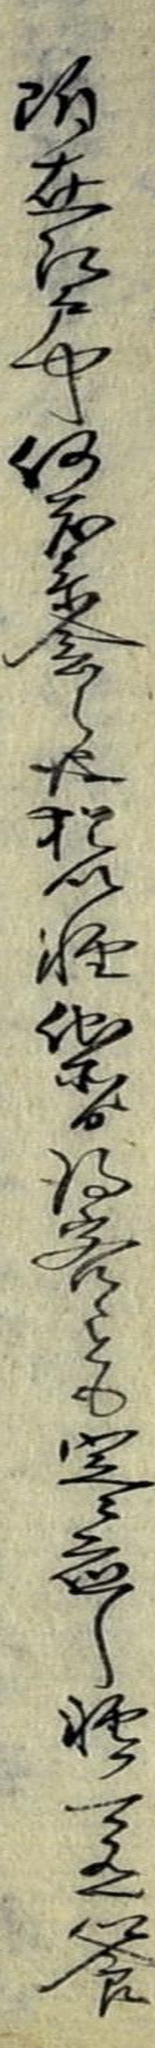附在江戸中何茂参会之儀猶以軽他所ゟ得客候とも定ニ応し軽ク可有饗
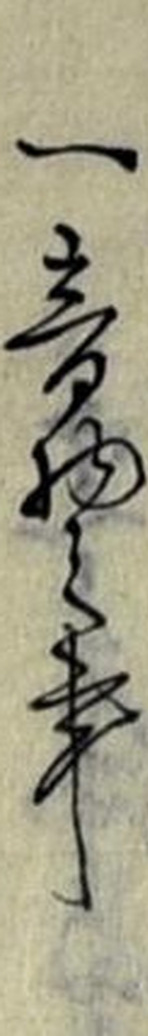一音物之事
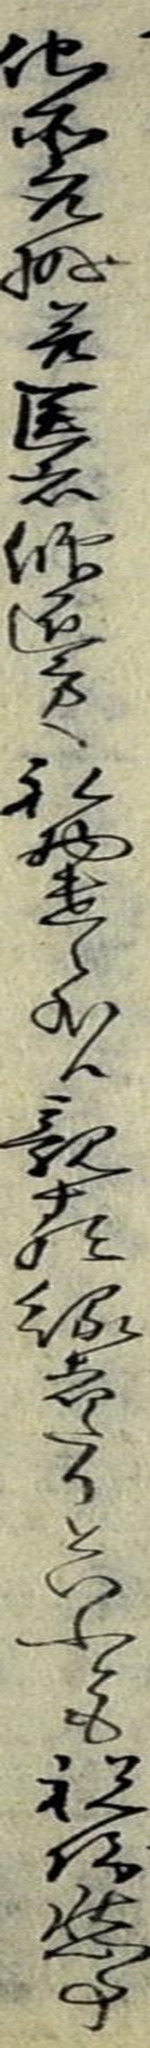他所取扱并医者師匠方へ礼物遣候外ハ親類縁者たりといふとも祝儀愁事
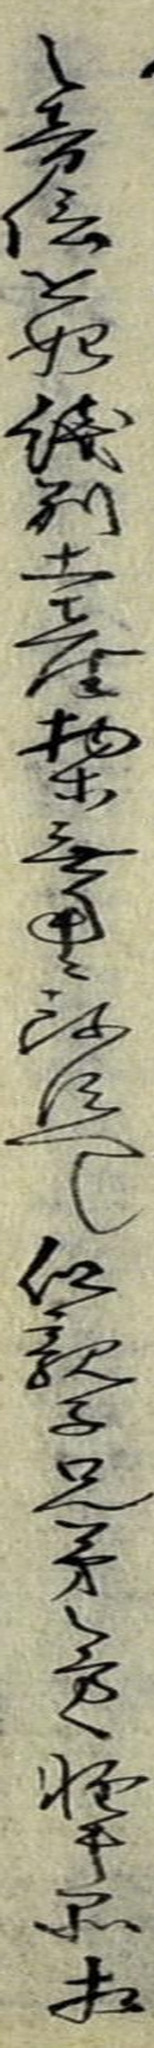之音信を始餞別土産物等無用ニ致すへし但親子兄弟之方へ軽キ品相
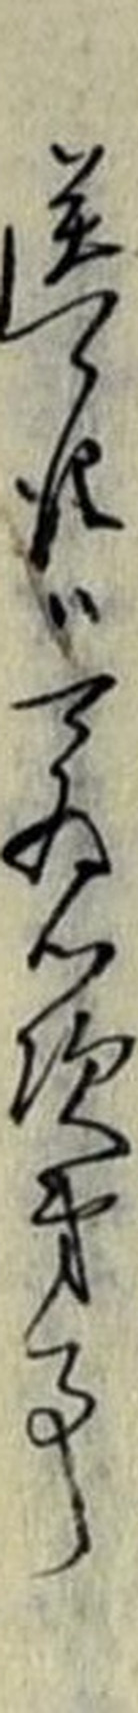送候儀ハ可為心次第事
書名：命令之部 一
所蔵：福井県文書館 Fukui Prefectural Archives
